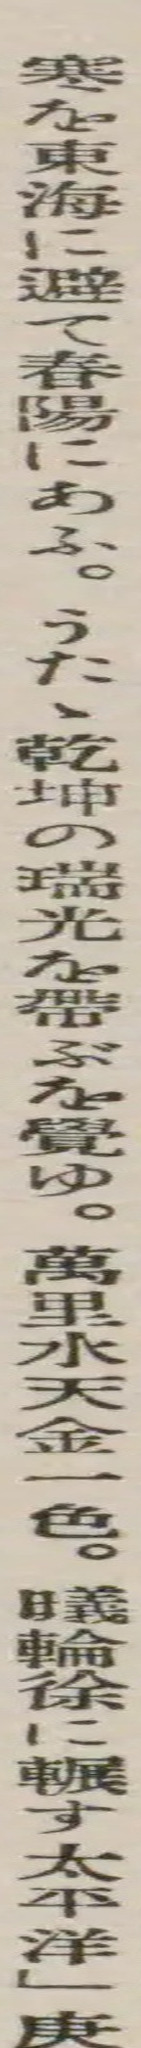寒を東海に避て春陽にあふ。うたゝ乾坤の瑞光を帯ぶを覚ゆ。万里水天金一色。㬢輪徐に輾す太平洋」庚
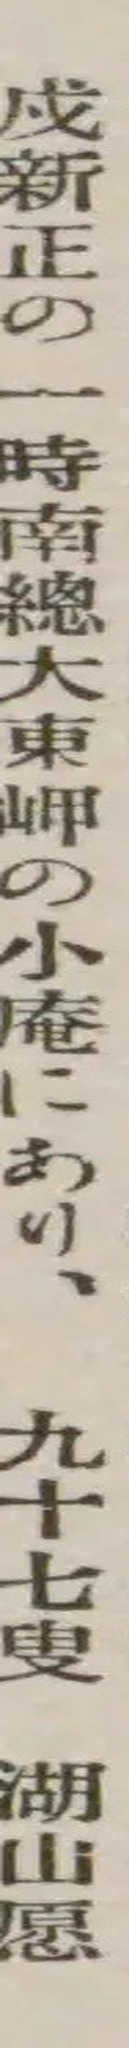戌新正の一時南総大東岬の小庵にあり、九十七叟湖山愿
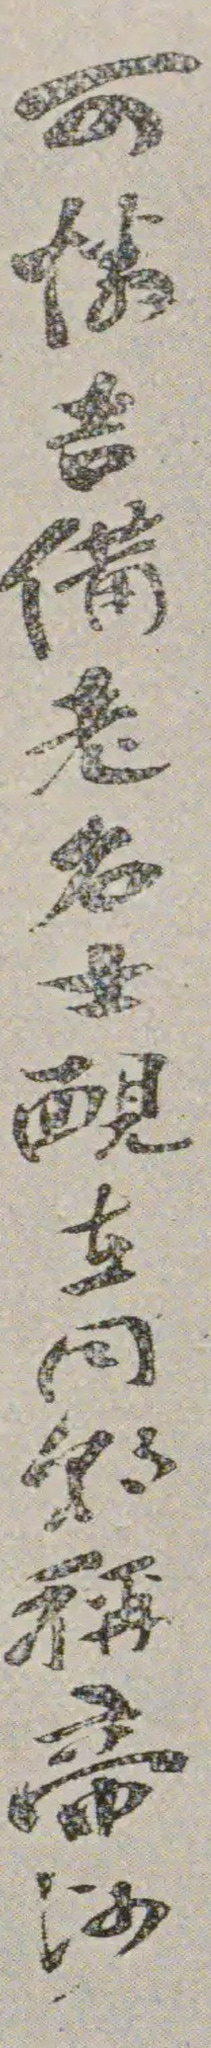可憐吉備老名士靦在同朝稱帝師

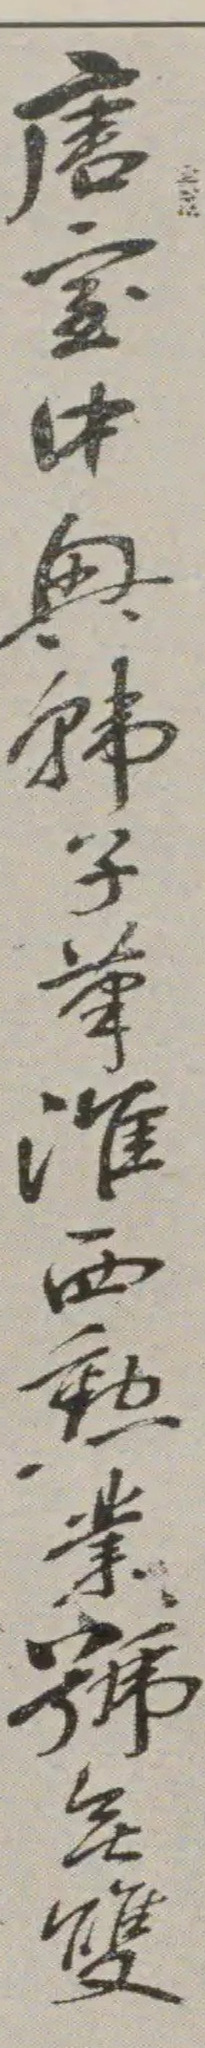唐室中興韓子筆淮西勲業號無雙
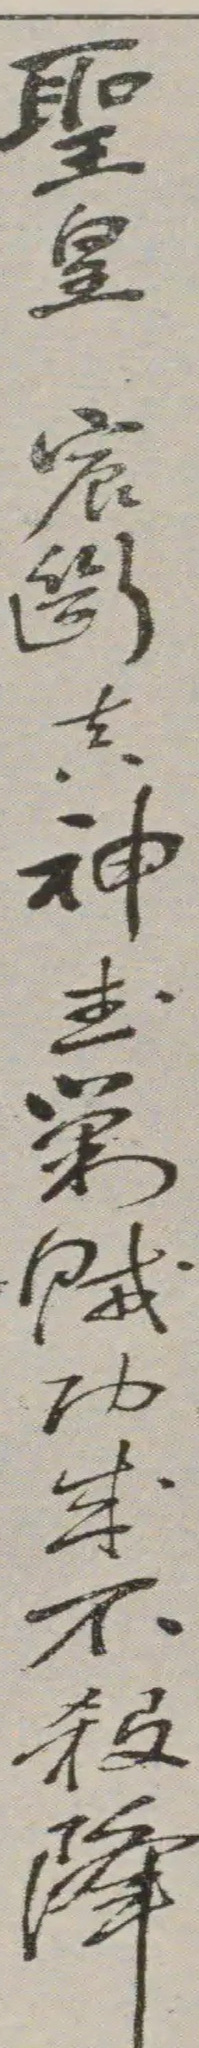聖皇宸斷真神武剿賊功成不殺降
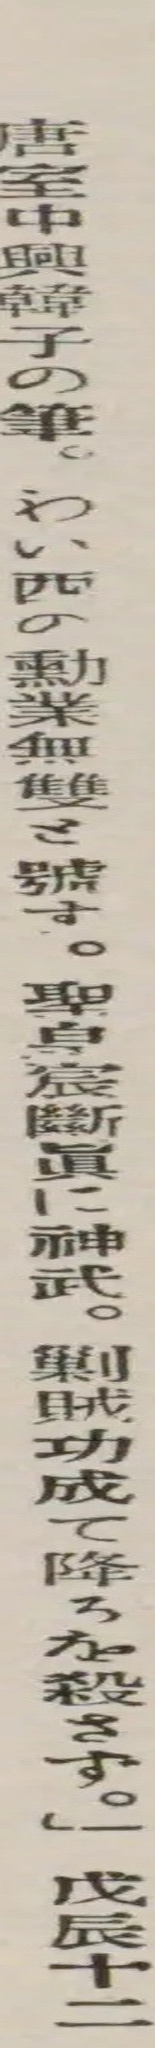唐室中興韓子の筆。わい西の勲業無双と号す。聖皇宸断真に神武。剿賊功成て降るを殺さず。」戊辰十二
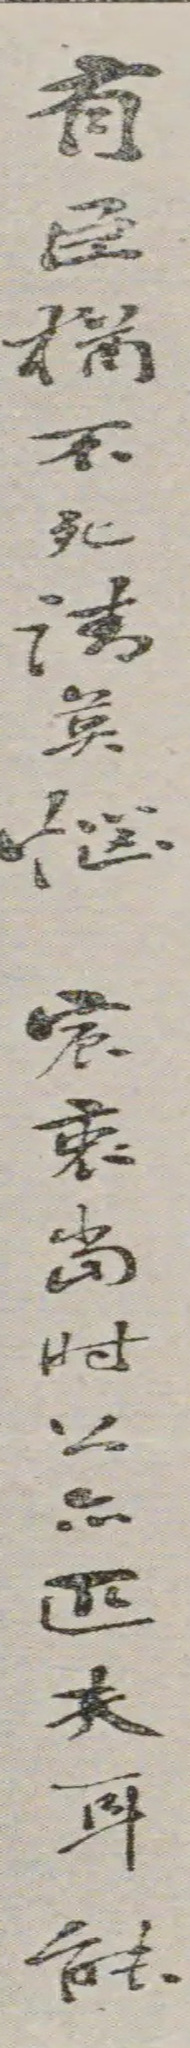有臣猶不死請莫悩宸裏当時公亦匹夫耳能
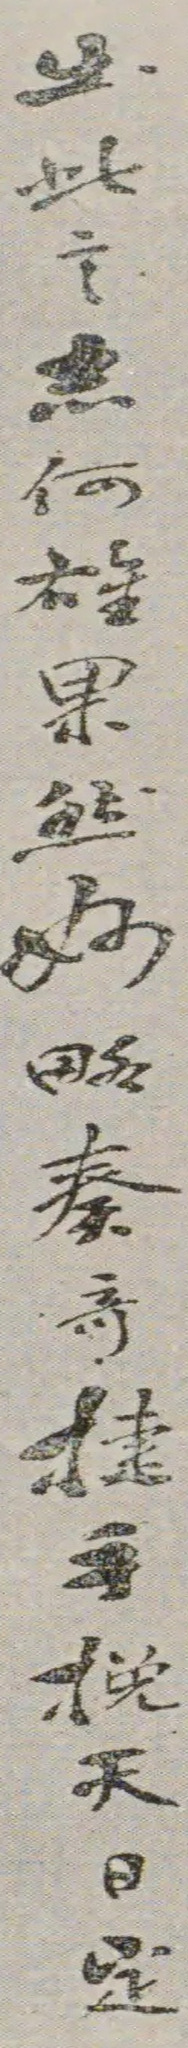出此言志何雄果然妙略奏奇捷手挽天日定
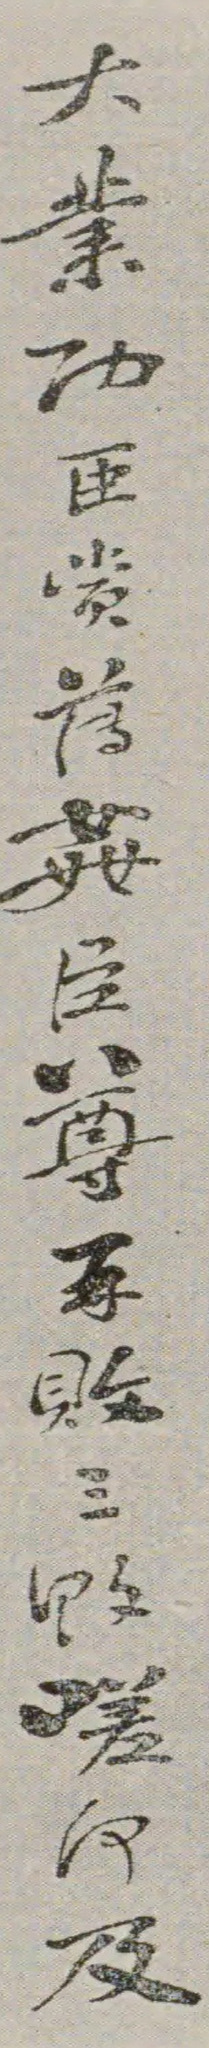大業功臣賞薄姦臣尊再敗三敗嗟何及

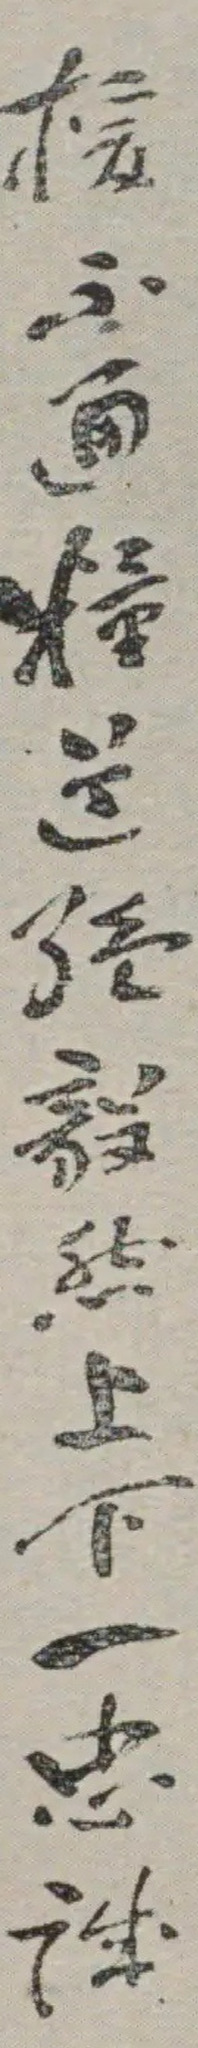援不通糧道絶毅然上下一忠誠
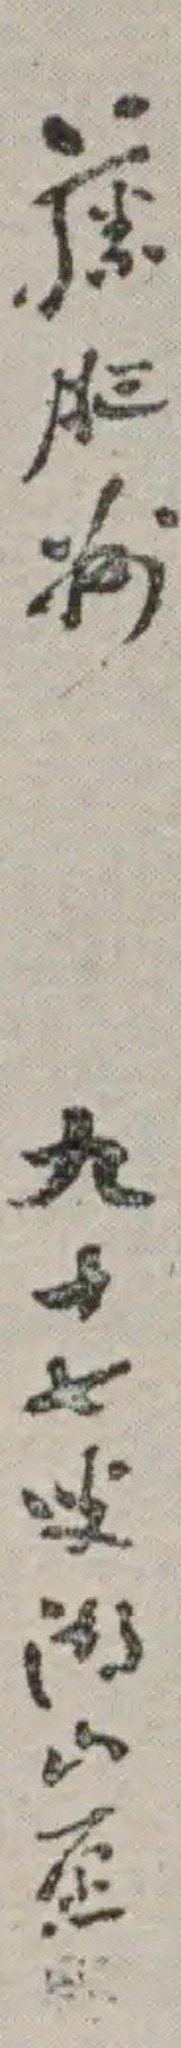藤肥州九十七叟湖山愿
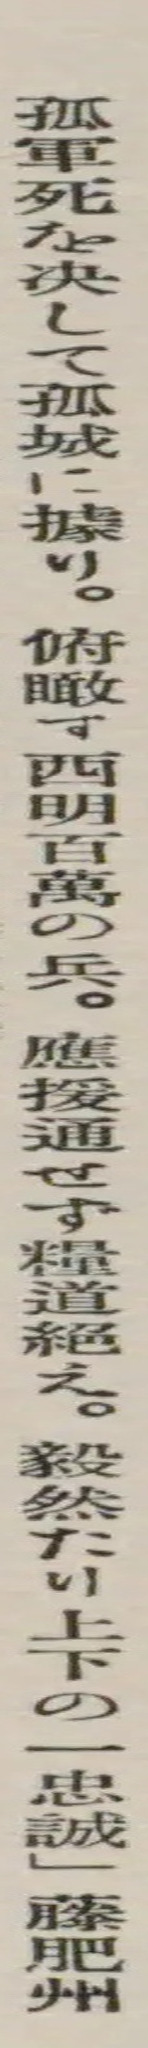孤軍死を決して孤城に拠り。俯瞰す西明百万の兵。応援通せず糧道絶え。毅然たり上下の一忠誠」藤肥州
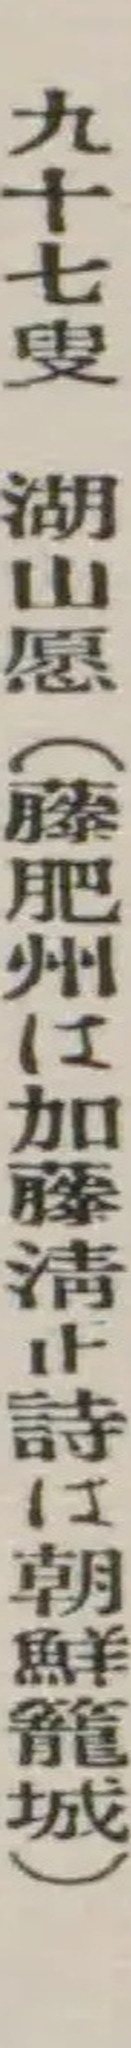九十七叟湖山愿(藤肥州は加藤清正詩は朝鮮籠城)
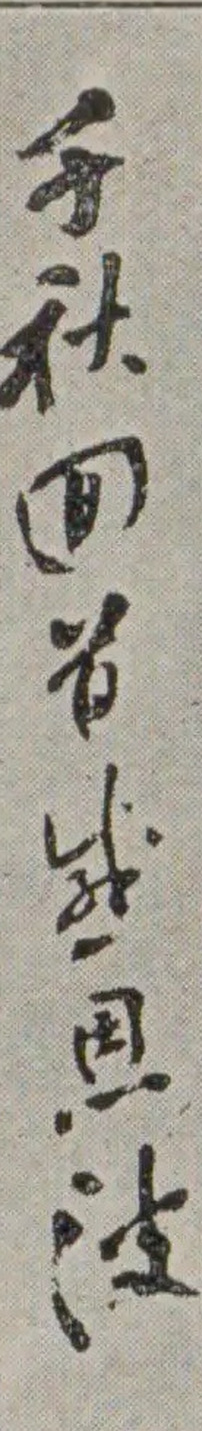千秋回首感恩波
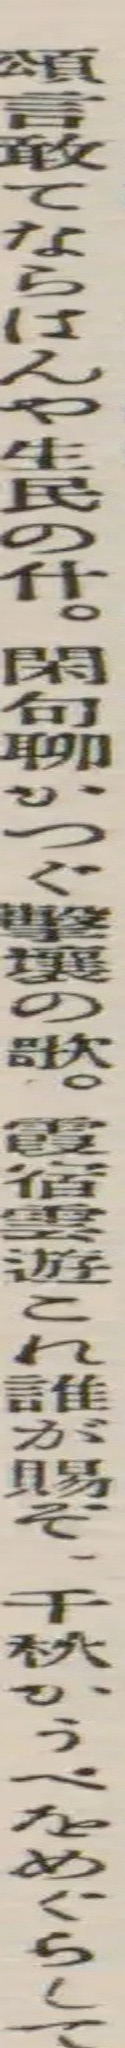頌言敢てならはんや生民の什。閑句聊かつぐ撃壌の歌。霞宿雲遊これ誰が賜ぞ。千秋かうべをめぐらして
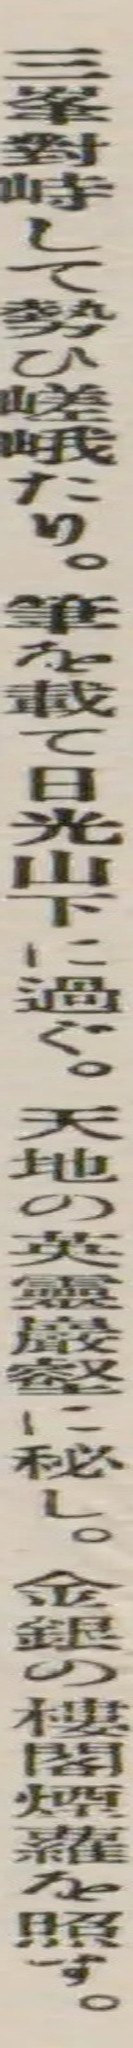三峰対峙して勢ひ嵯峨たり。筆を載て日光山下に過ぐ。天地の英霊巌壑に秘し。金銀の楼閣煙蘿を照す。
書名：小野湖山翁小伝
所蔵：国立国会図書館 National Diet Library, JAPAN
